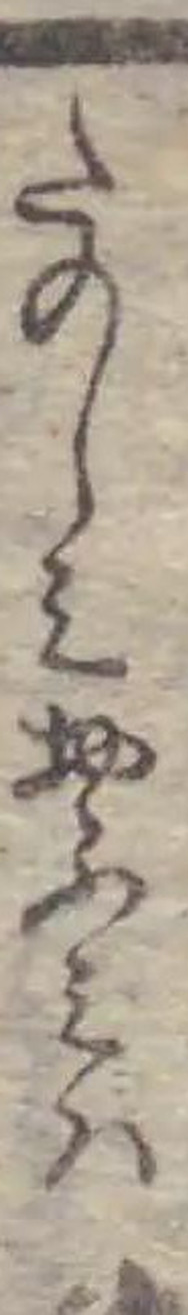たのしみおふみは
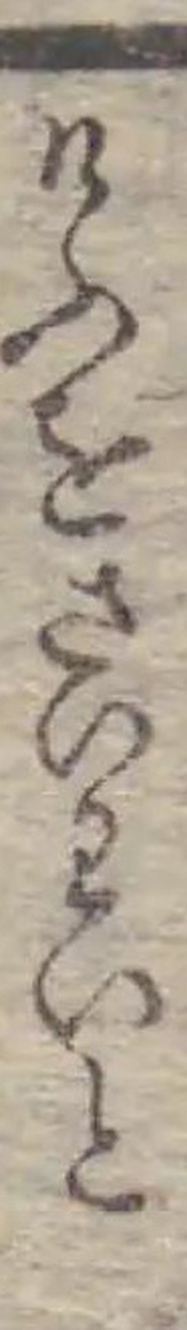けふをさいわいと
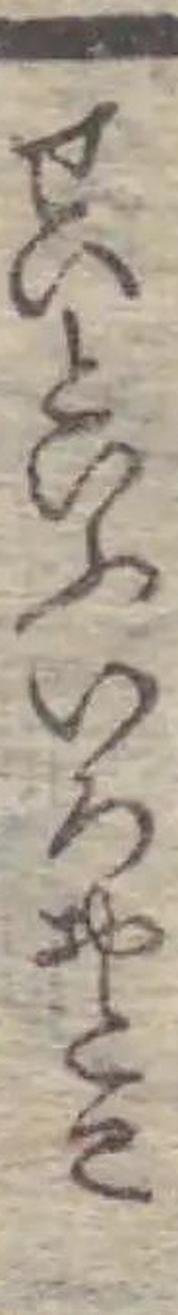せいといふいろおとこ
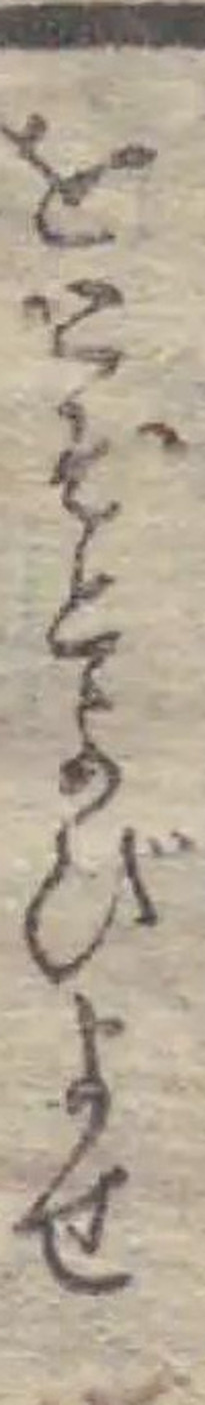をこそとよびよせ
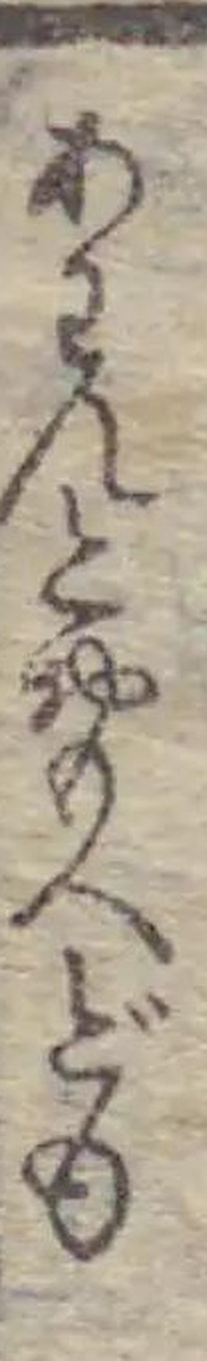あわんとおもへども
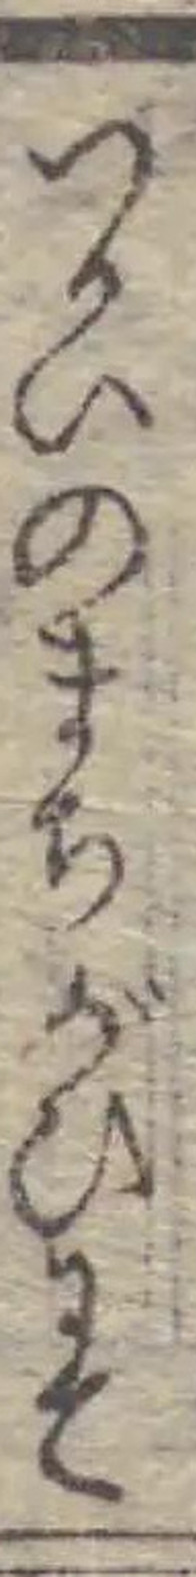つかいのまちがひにて
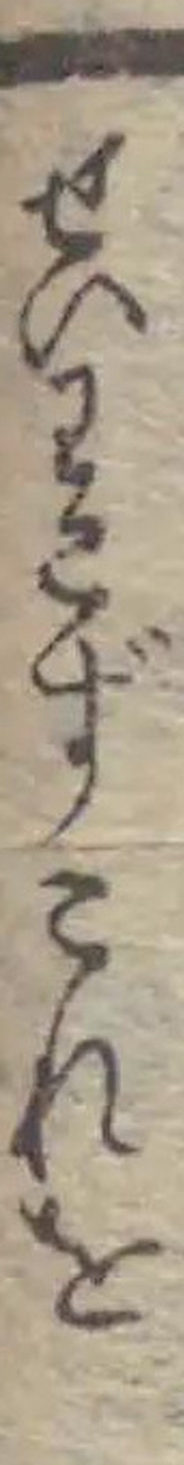せいわこずこれを
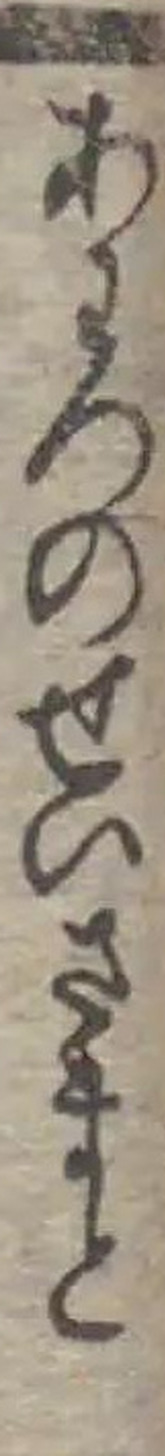あわつのせいさまと
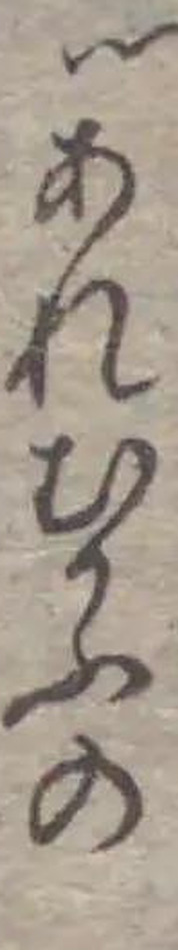〽あれむかふの
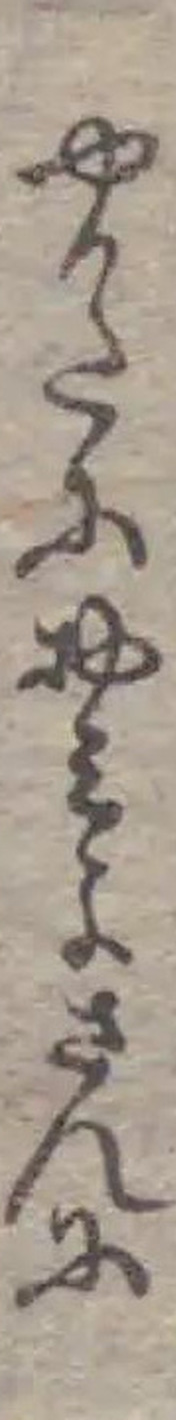やかたにおみよさんに
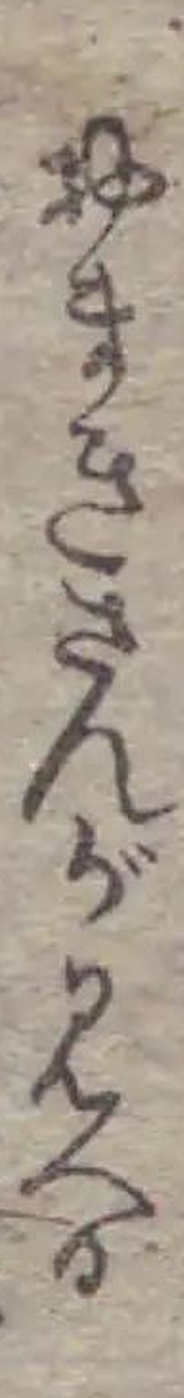おまきさんが見へる
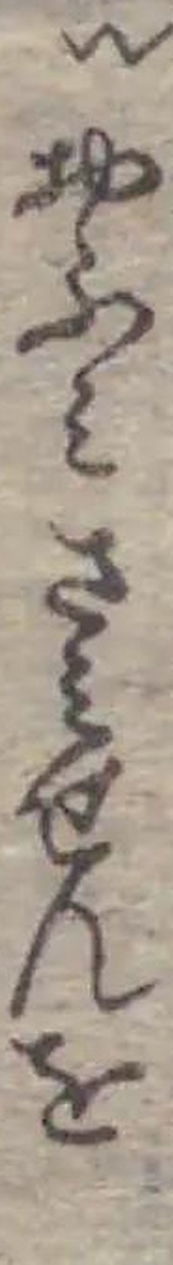〽おふみさみせんを
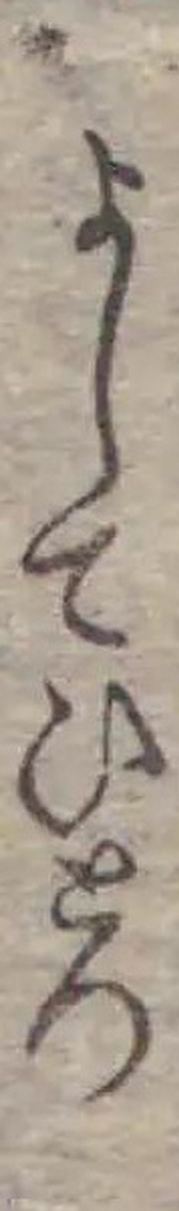よしてひとつ
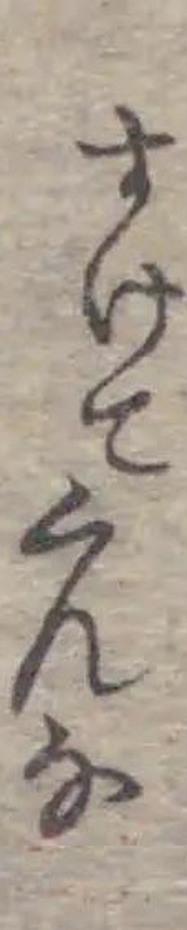すけてくんな

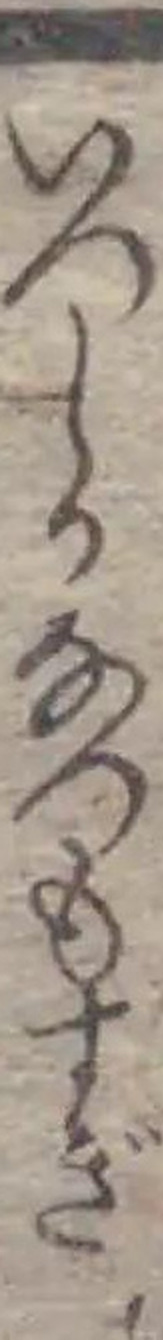いつしかなつもすぎ
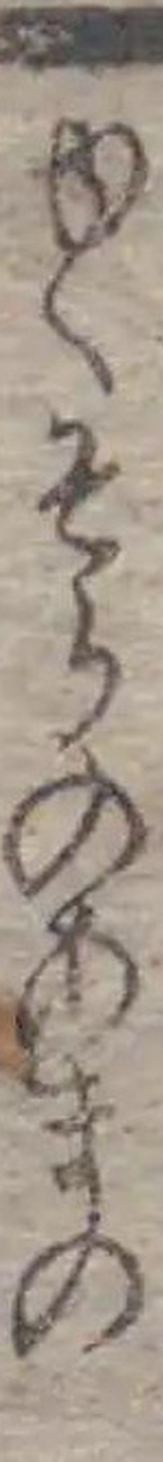ゆくそらのあまの
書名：かんなんの夢枕 2巻
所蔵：国立国会図書館 National Diet Library, JAPAN
